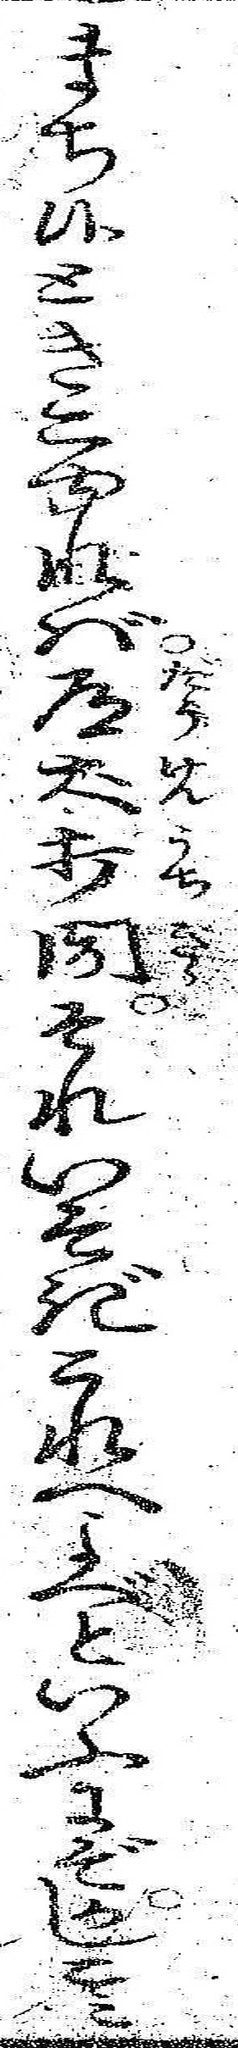まち候ときこゆれば。道太打聞。それいそぎこれへよべといふにぞ。かしこみ
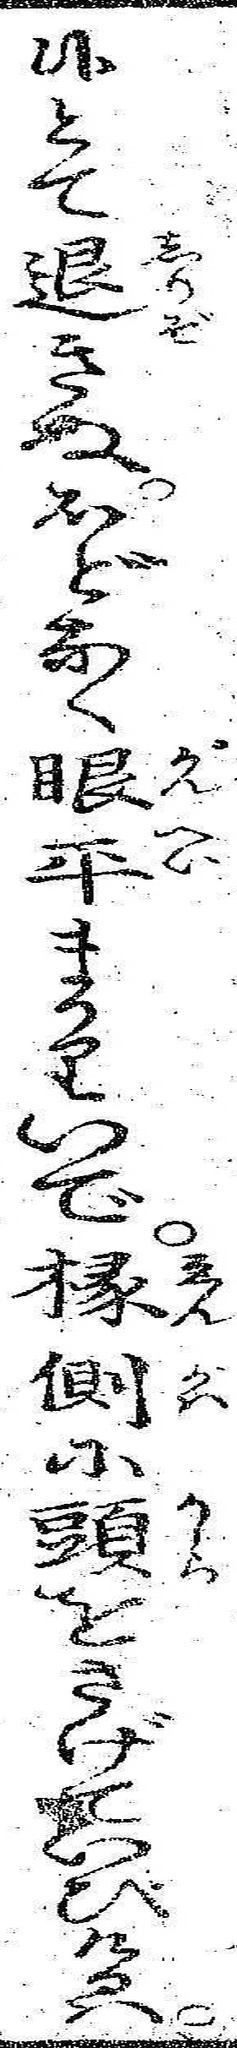候とて退きぬ。ほどなく眼平まかりいで。椽側に頭をさげていひけるは。
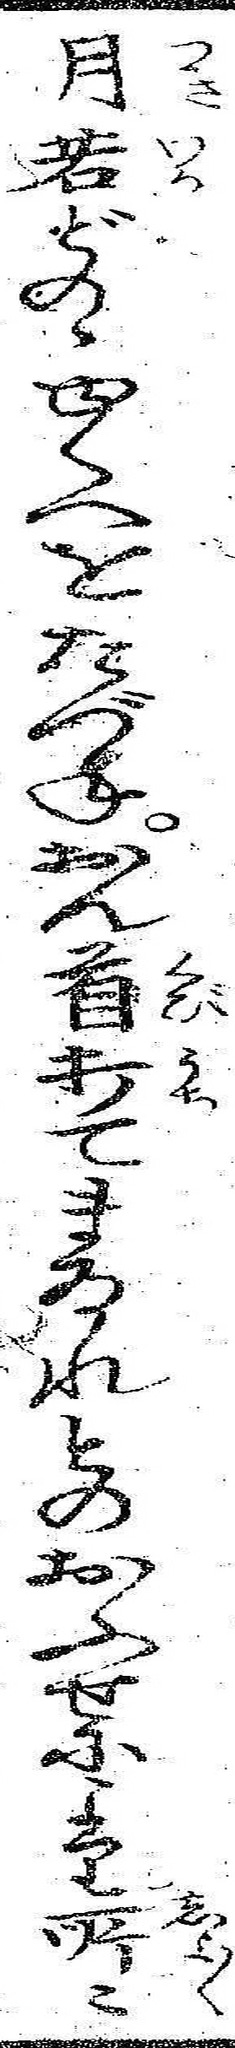月若どのゝゆくへをたづね。おん首打てまゐれとのおふせにより。所々
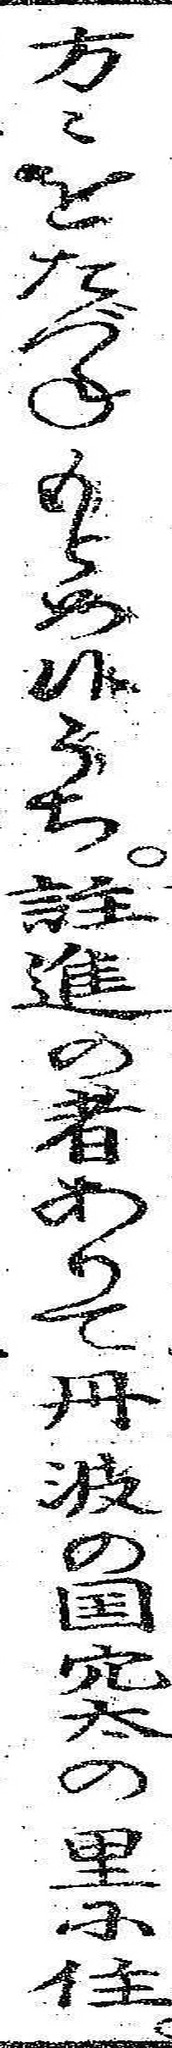方々をたづねもとめ候うち。註進の者ありて。丹波の国穴太の里に住。
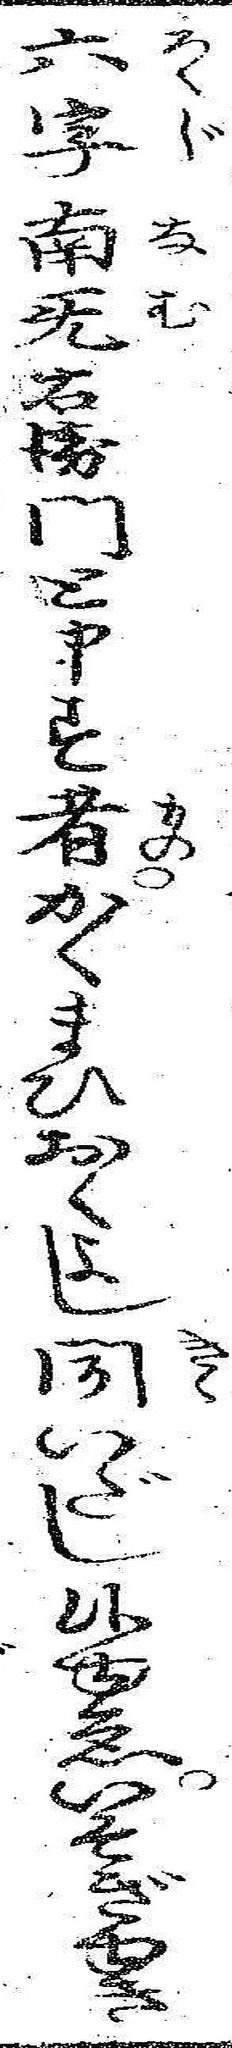六字南無右衛門と申す者。かくまひおくよし聞いだし候ゆゑ。いそぎゆき
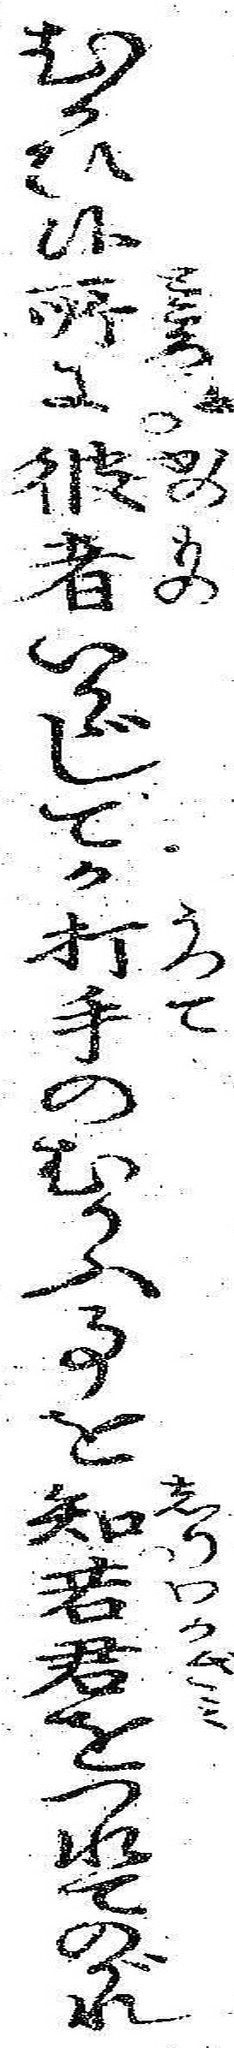むかひ候所に。彼者いかゞしてか打手のむかふ事を知。若君をつれてのがれ
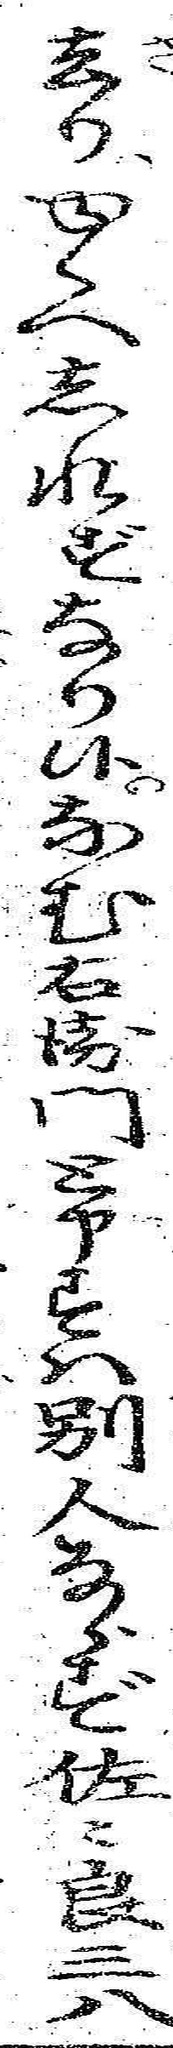去り。ゆくへしれずなり候。なむ右衛門と申すは別人ならず。佐々良三八
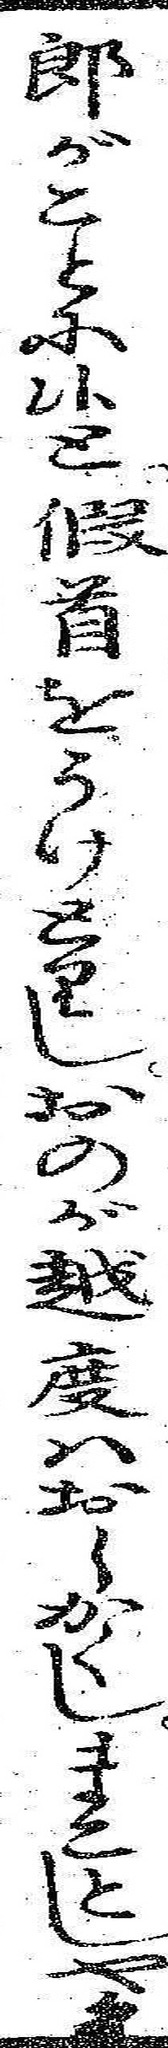郎がことに候と。仮首をうけとりし。おのが越度はおしかくし。まことしやか
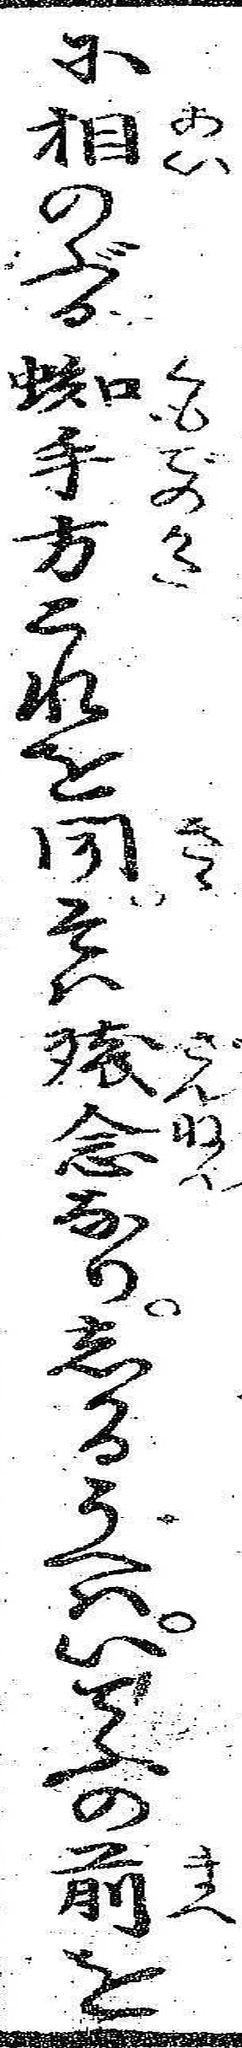に相のぶる。蜘手方これを聞。そは残念なり。しかるうへは。いてふの前を
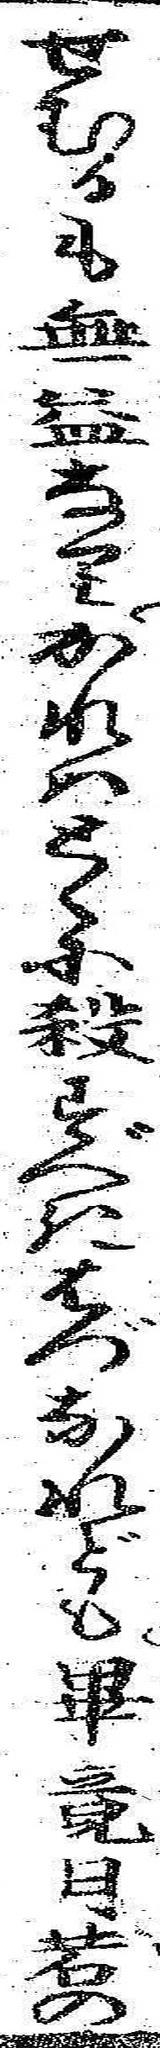せむるも無益なり。かれはとくに殺すべきはづなれども。畢竟月若の
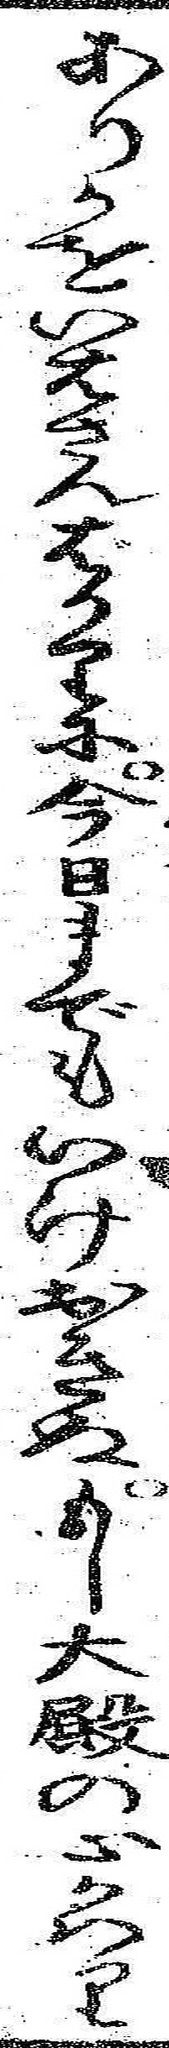ありかをいはさんばかりに。今日までもいけおきぬ。もし大殿の心かはり
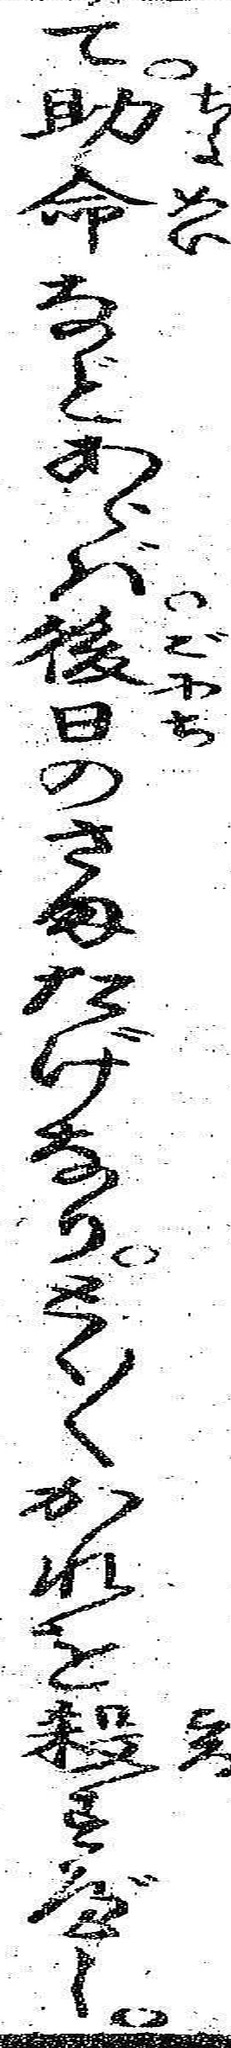て。助命などあらば。後日のさまたげなり。とく〳〵かれを殺すべし。
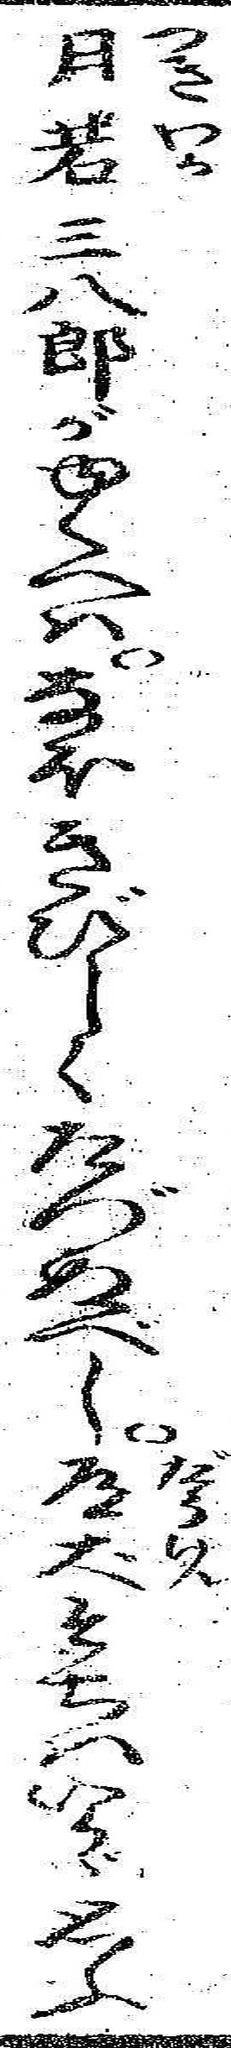月若三八郎がゆくへは。なほきびしくたづぬべし。道犬そちはいかゞ思ふ
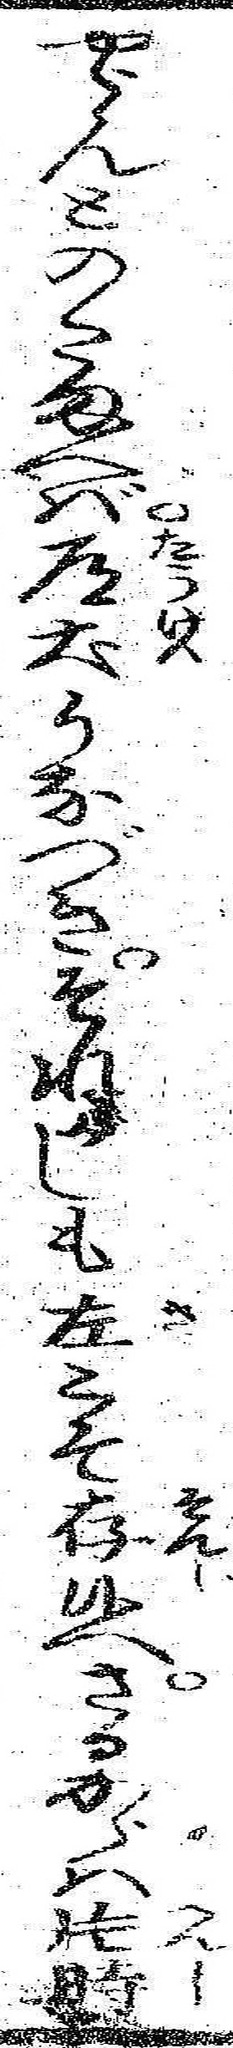やらんとのたまへば。道犬うなづき。それがしも左こそ存候へ。さるからは片時
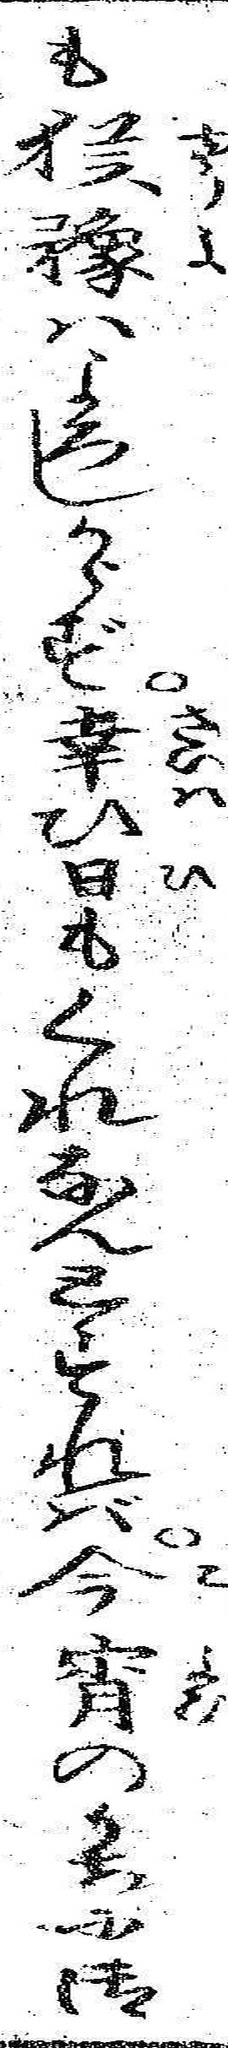も猶予はよろしからず。幸ひ日もくれなんとすれば。今宵のうちに御
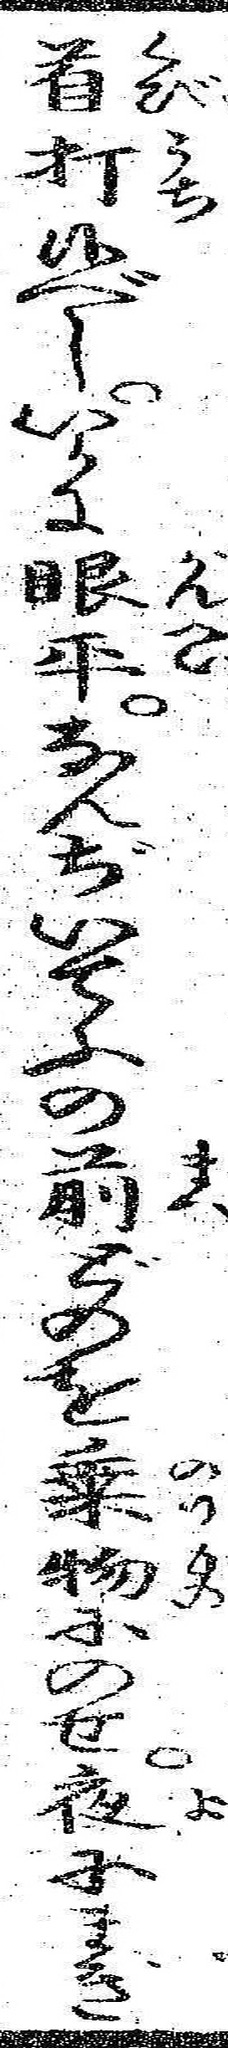首打候べし。いかに眼平。なんぢいてふの前どのを乗物にのせ。夜にまぎ
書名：昔話稲妻表紙
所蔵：国文学研究資料館
